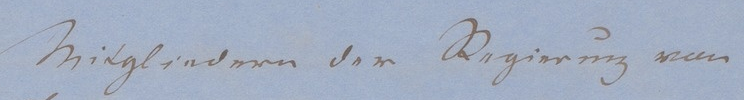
Mitgliedern der Regierung von
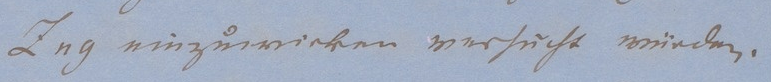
Zug einzuwirken versucht würde.
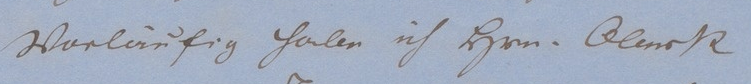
Vorläufig habe ich Hrn. Oberst
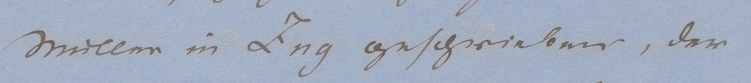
Müller in Zug geschrieben, der
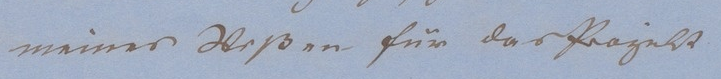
meines Wißen für das Projekt
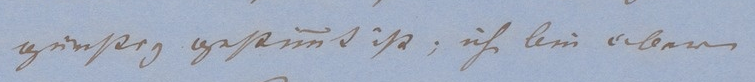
günstig gestimmt ist; ich bin aber
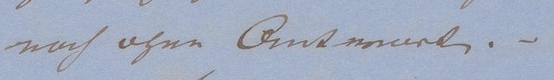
noch ohne Antwort. –
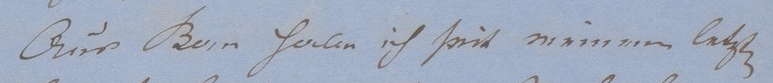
Aus Bern habe ich seit meinem letzten
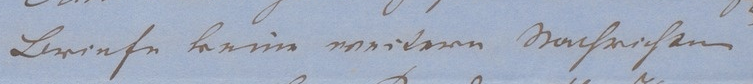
Briefe keine weitern Nachrichten
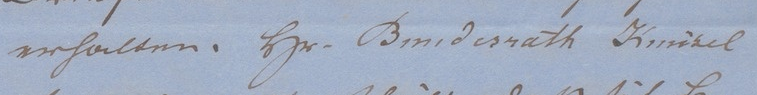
erhalten. Hr. Bundesrath Knüsel
